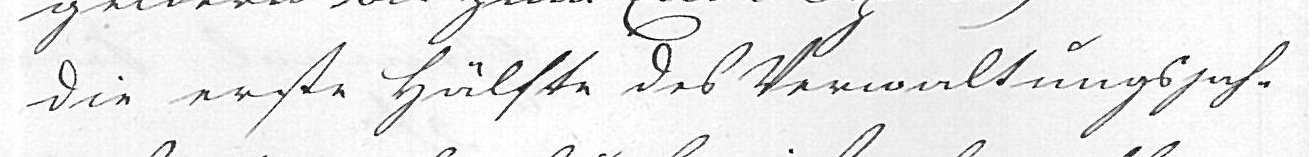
die erste Hälfte des Verwaltungsjah-
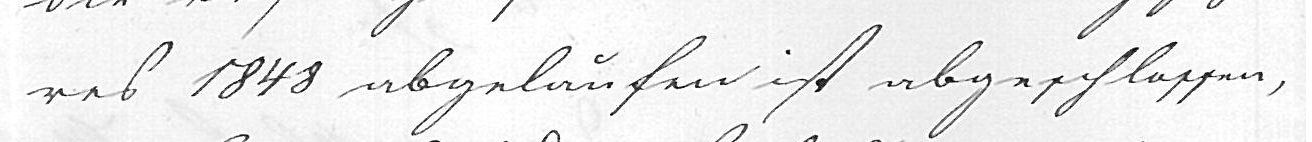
res 1848 abgelaufen ist abgeschlossen,
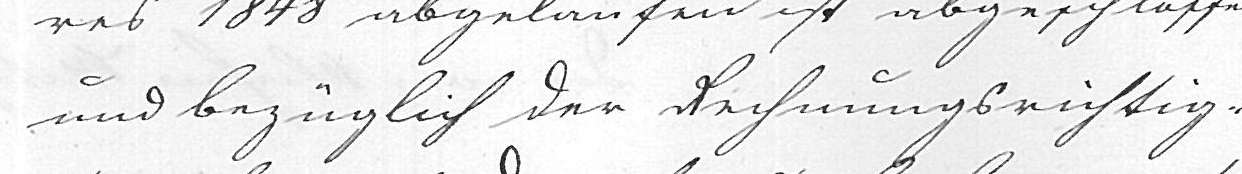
und bezüglich der Rechnungsrichtig-
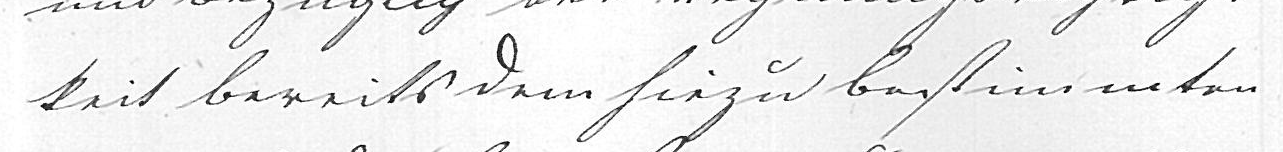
keit bereits dem hiezu bestimmten
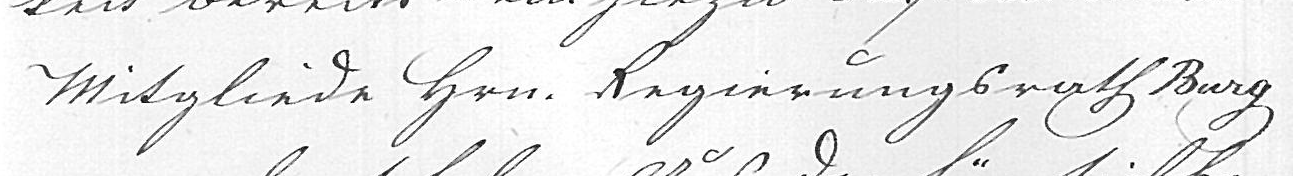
Mitgliede Hrn. Regierungsrath Burg
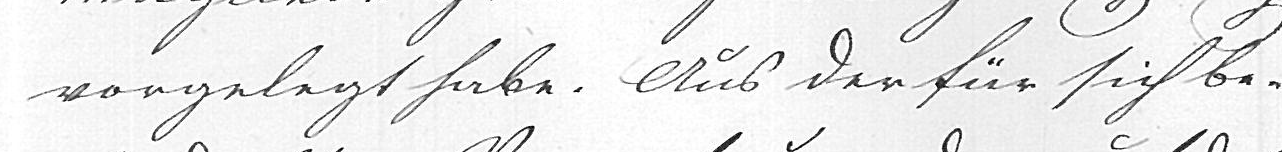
vorgelegt habe. Aus der für sich be-
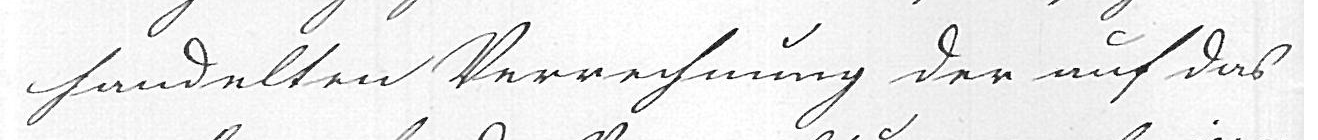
handelten Verrechung der auf das
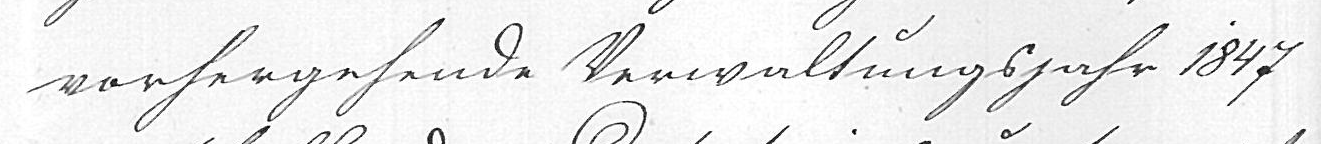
vorhergehenden Verwaltungsjahr 184
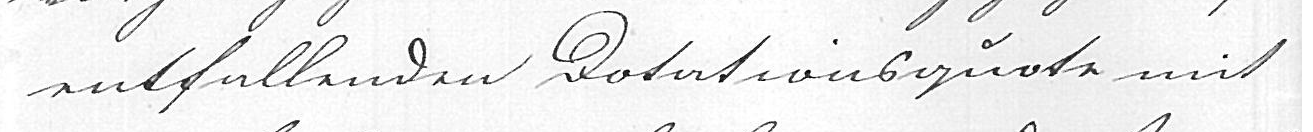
entfallenden Dotationsquote mit
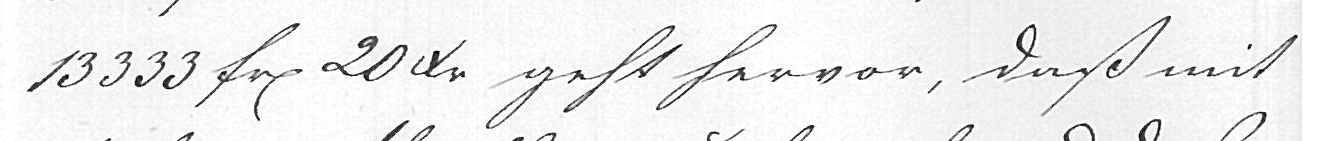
13333 fr 20 kr geht hervor, daß mit
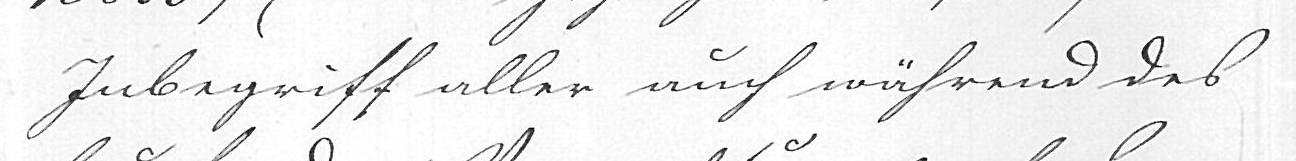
Inbegriff aller auch während des
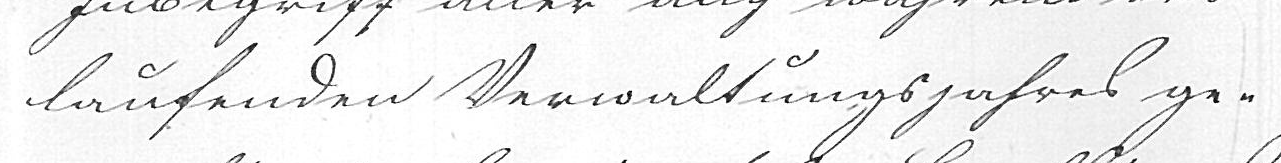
laufenden Verwaltungsjahres ge-
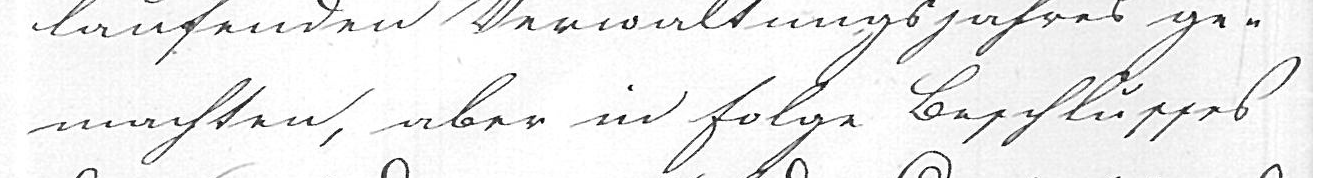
machten, aber an Folge Beschlusses
